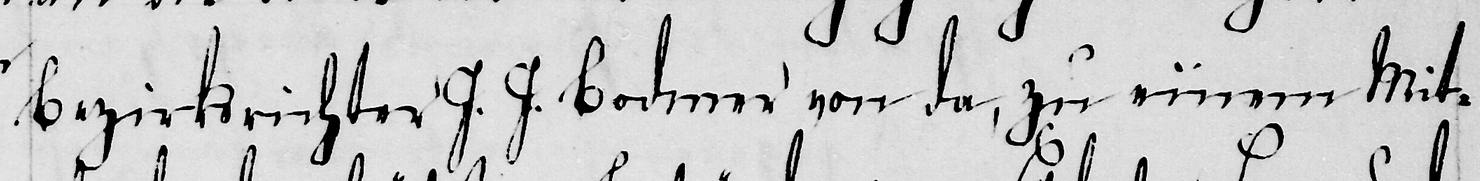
Bezirksrichter J. J. Bodmer von da, zu einem Mit¬
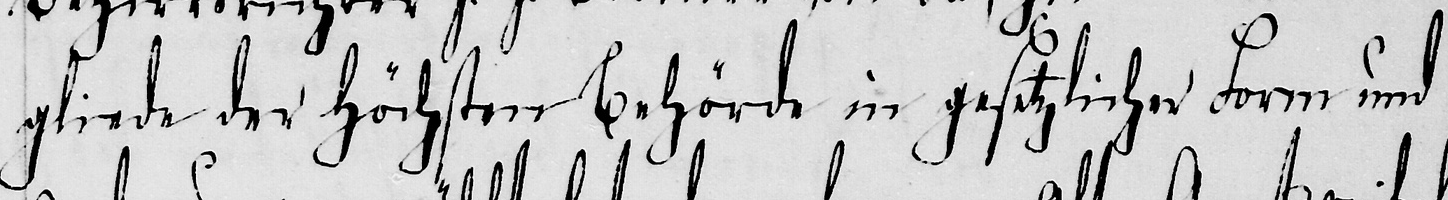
gliede der höchsten Behörde in gesetzlicher Form und
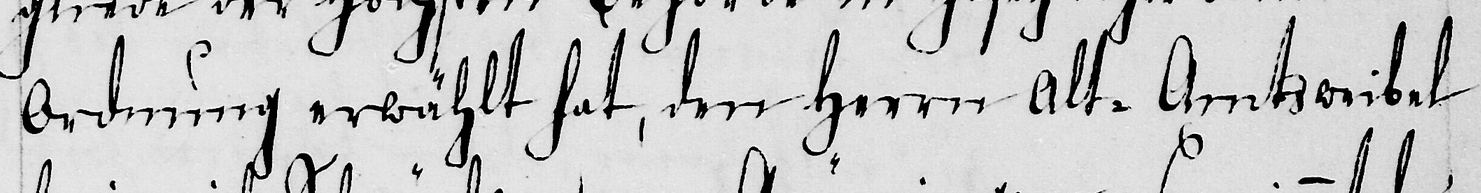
Ordnung erwählt hat, den Herrn Alt-Amtsweibel
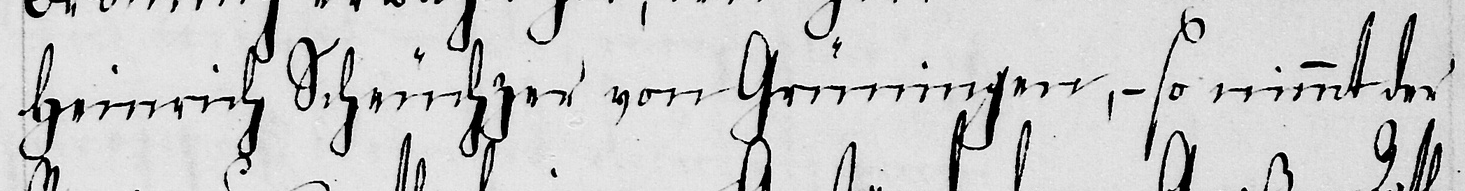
Heinrich Scheuchzer von Grüningen,– so nimmt der
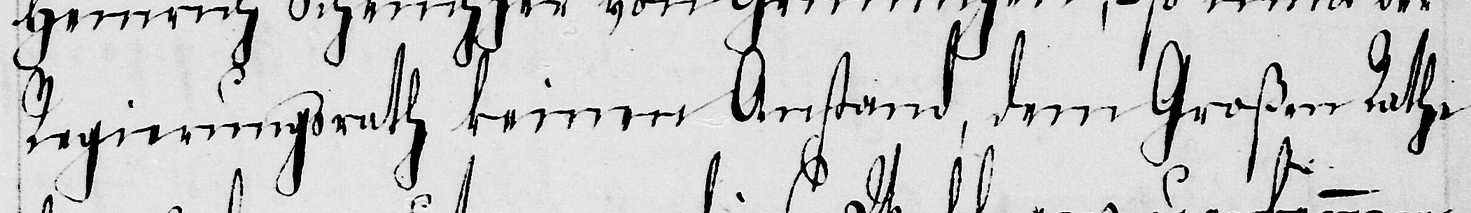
Regierungsrath keinen Anstand, dem Großen Rathe
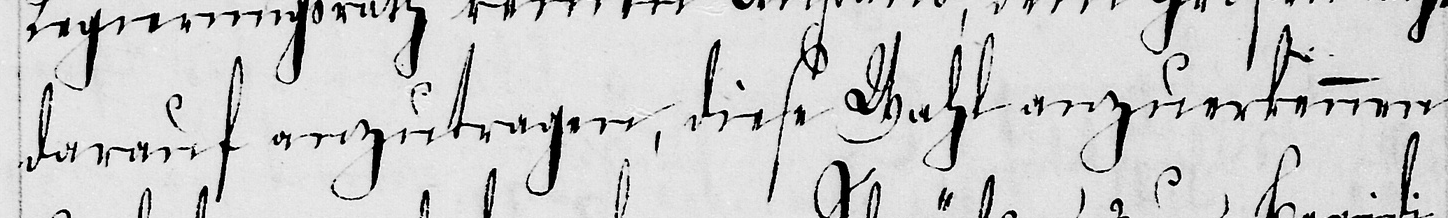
darauf anzutragen, diese Wahl anzuerkennen
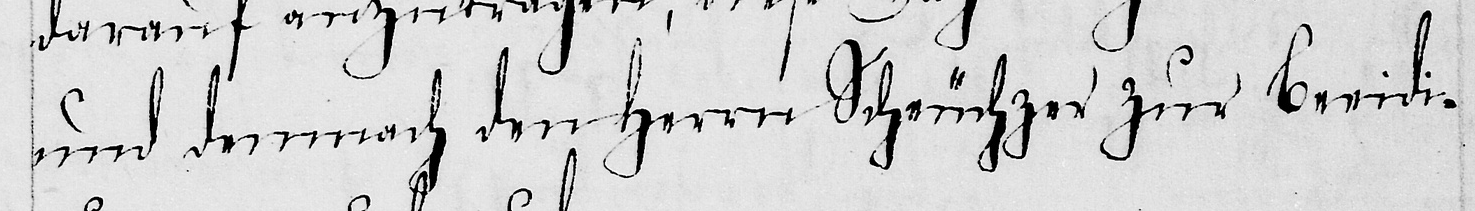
und demnach den Herrn Scheuchzer zur Beeidi¬
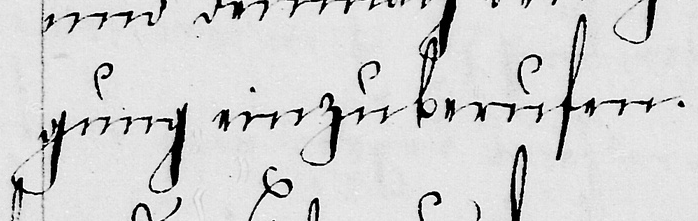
gung einzuberufen.
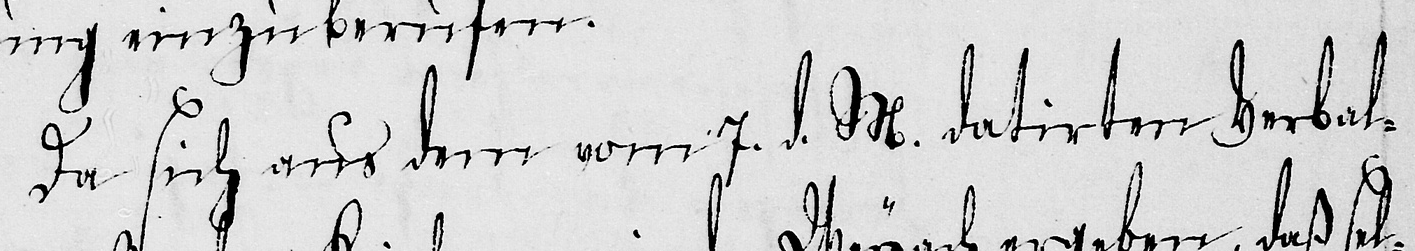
Da sich aus dem vom 7. d. M. datirten Verbal¬
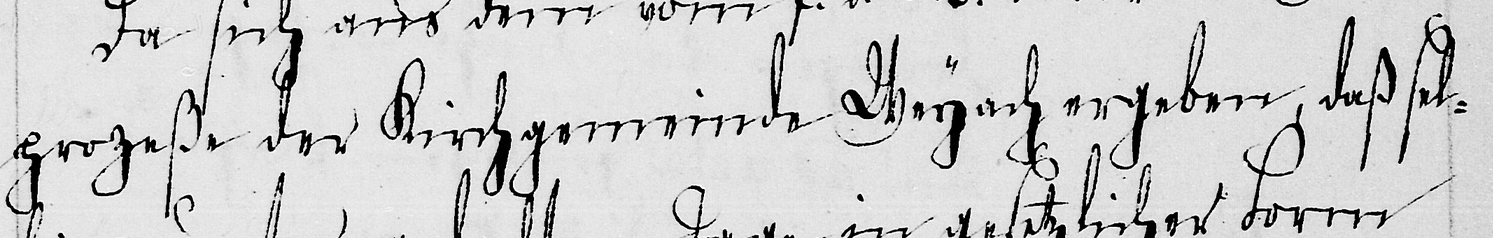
prozeße der Kirchgemeinde Weyach ergeben, daß sel¬
